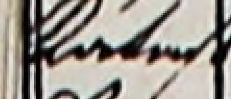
Katast
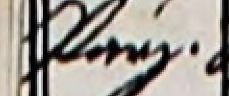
Parz.
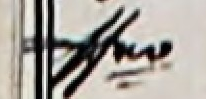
Hnr
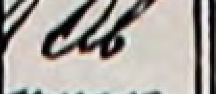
Ob
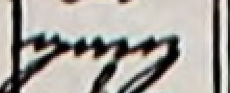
ganz
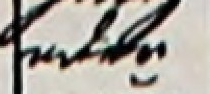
oder
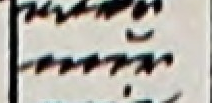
nur
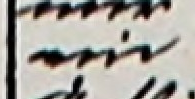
ein
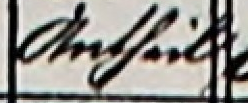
Antheil
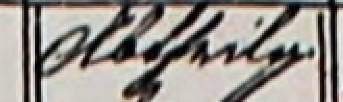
Abtheig.
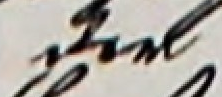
der
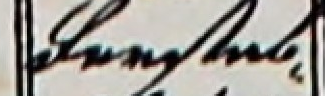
Fanstab„
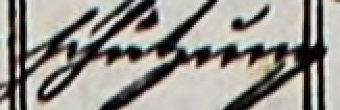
schätzung
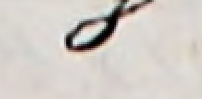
8
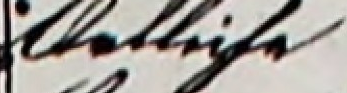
Örtliche
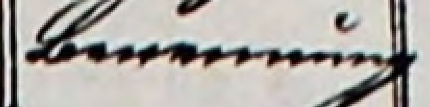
Benennung
